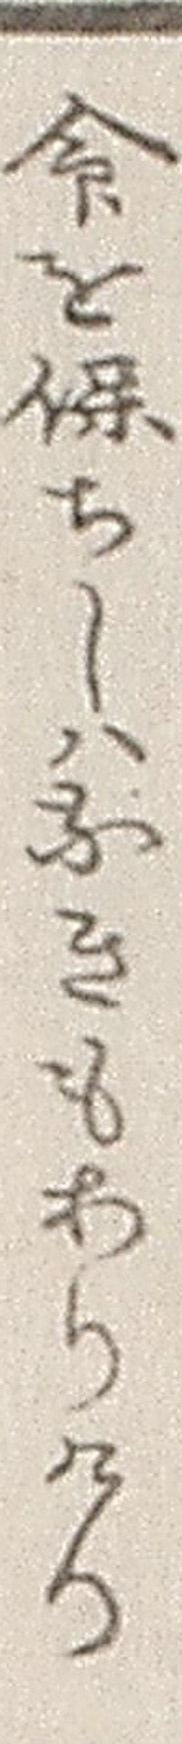命を保ちしはなきもありけり
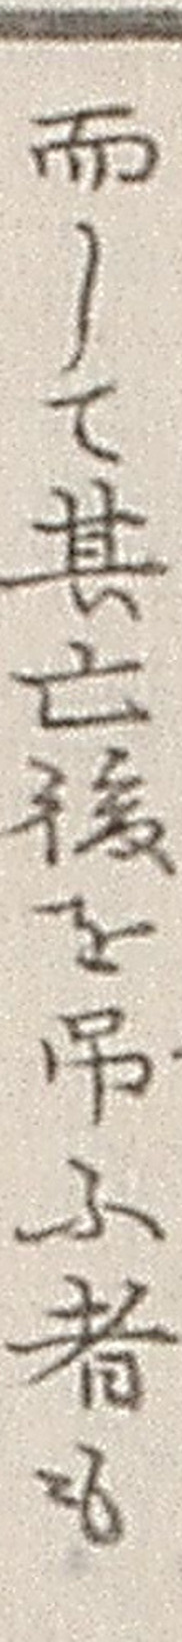而して其亡後を弔ふ者も
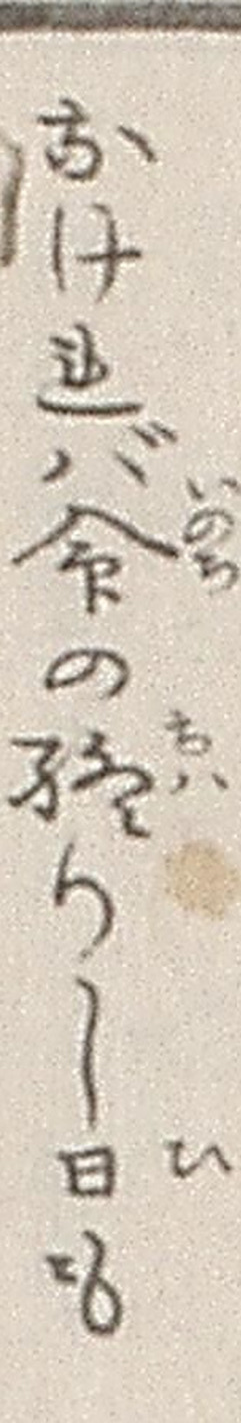なければ命の終りし日も
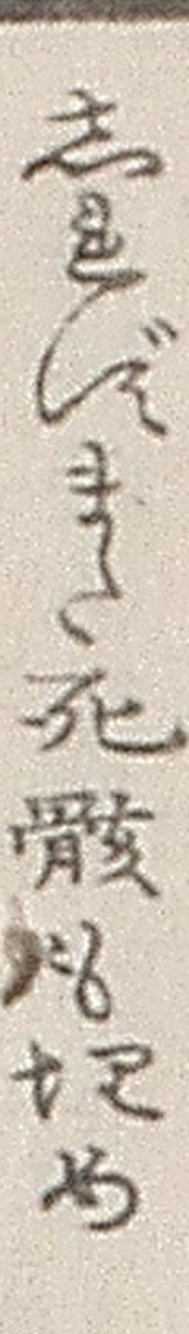しれずまた死骸も埋め
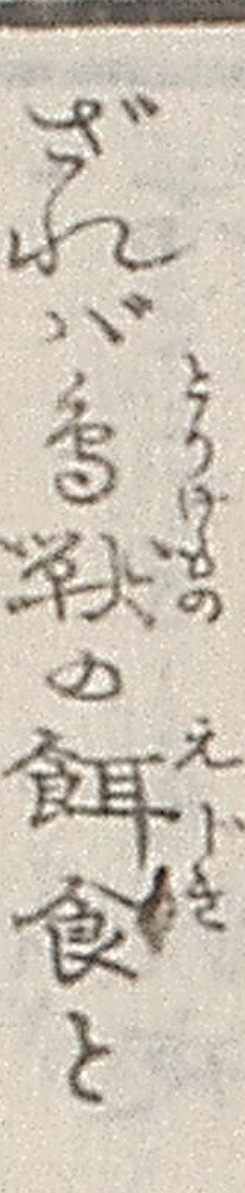ざれば鳥獣の餌食と
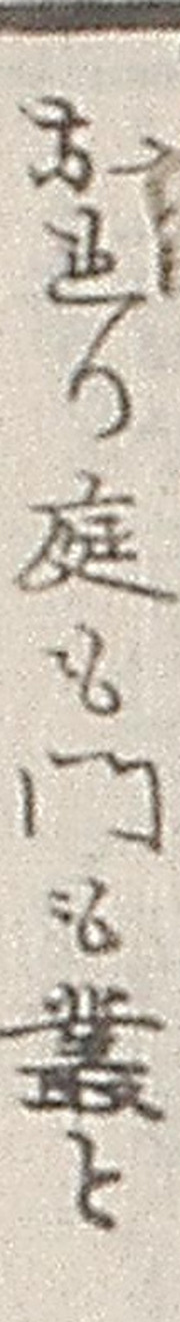なれり庭も門も叢と
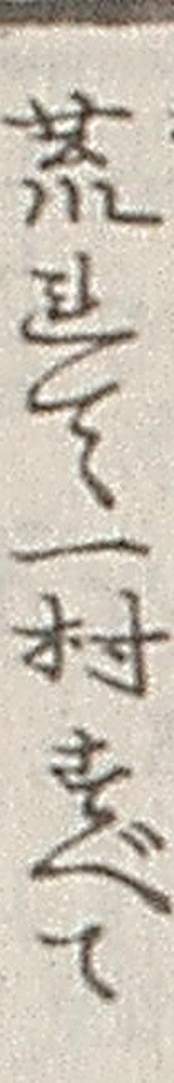荒れて一村すべて
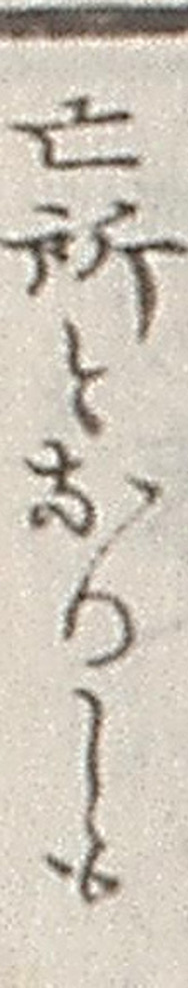亡所となりしも
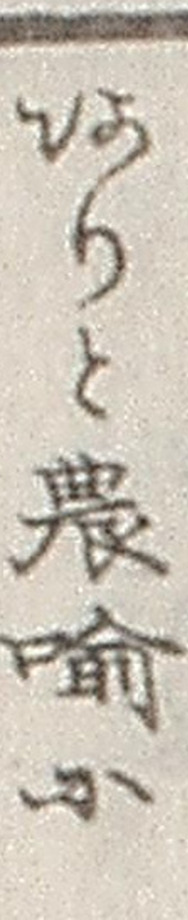ありと農喩に
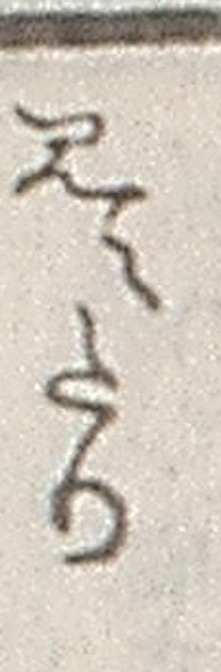見えたり

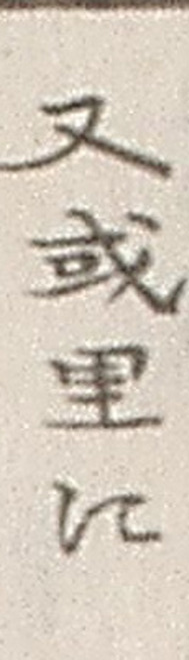又或里に
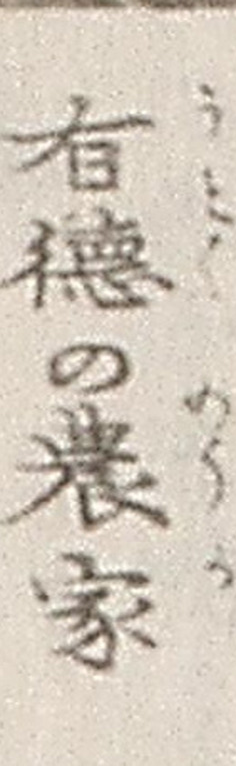有徳の農家
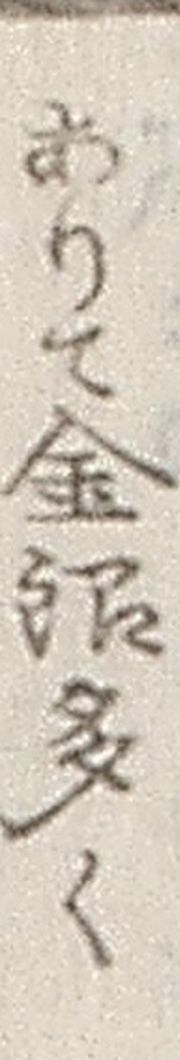ありて金銀多く
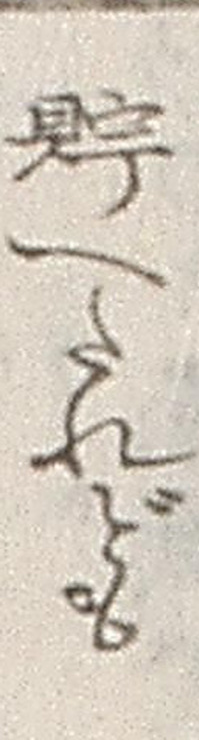貯へたれども
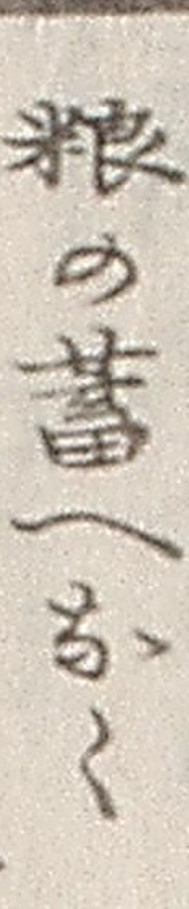粮の蓄へなく
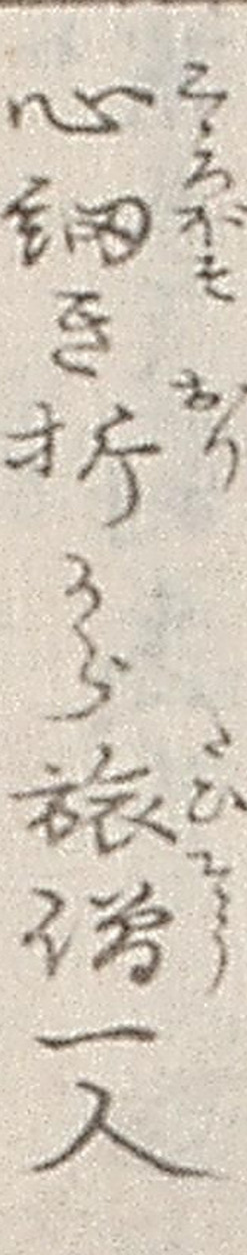心細き折から旅僧一人
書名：凶荒図録　完
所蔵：東京大学地震研究所図書室 Earthquake Research Institute Library, The University of Tokyo, JAPAN
